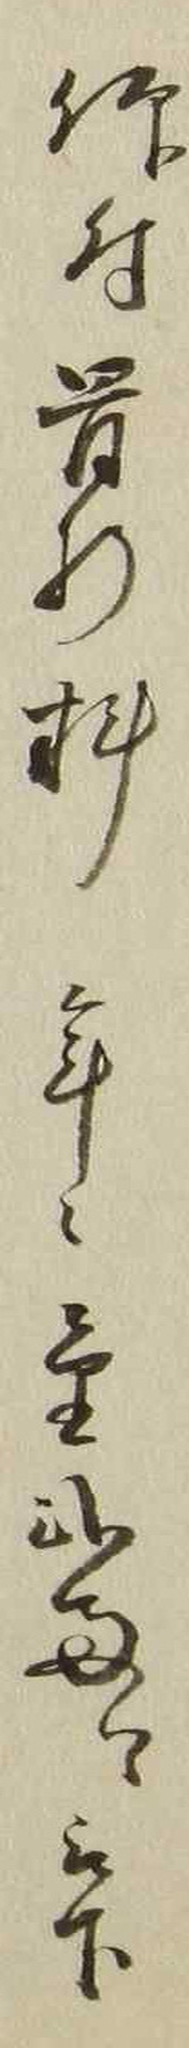仰付骨折料年々金弐両ツヽ被下
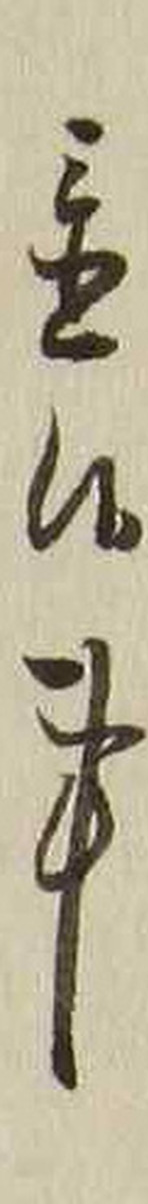置候事
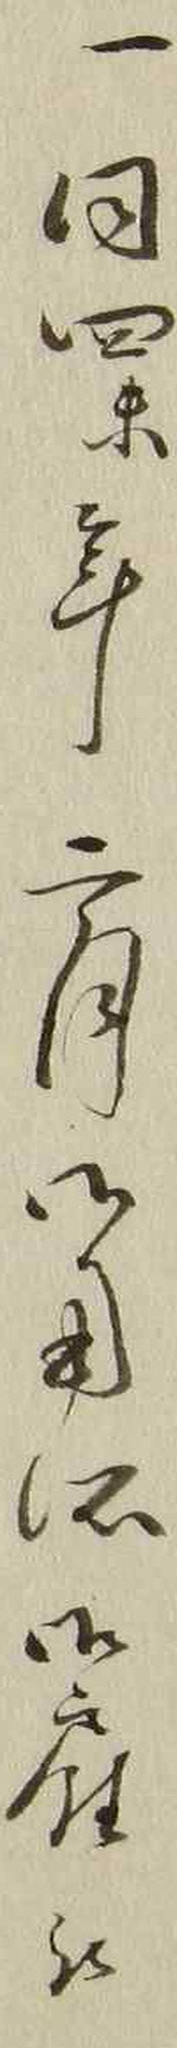一同四未年二月御用所御雇被
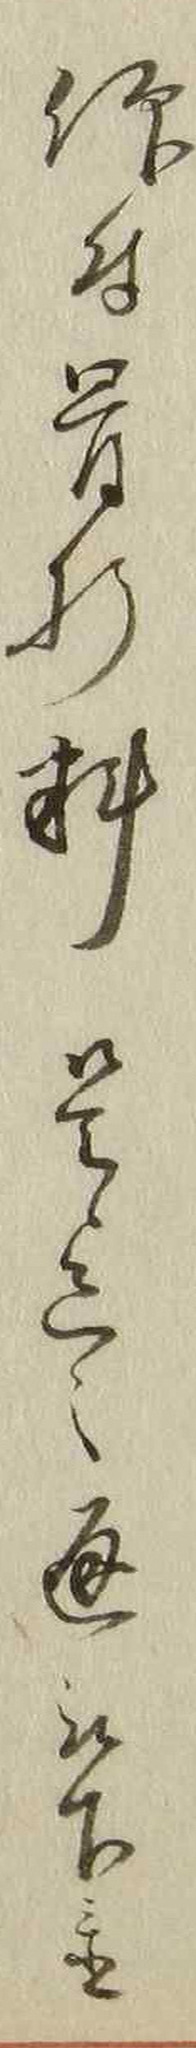仰付骨折料是迄之通被下置
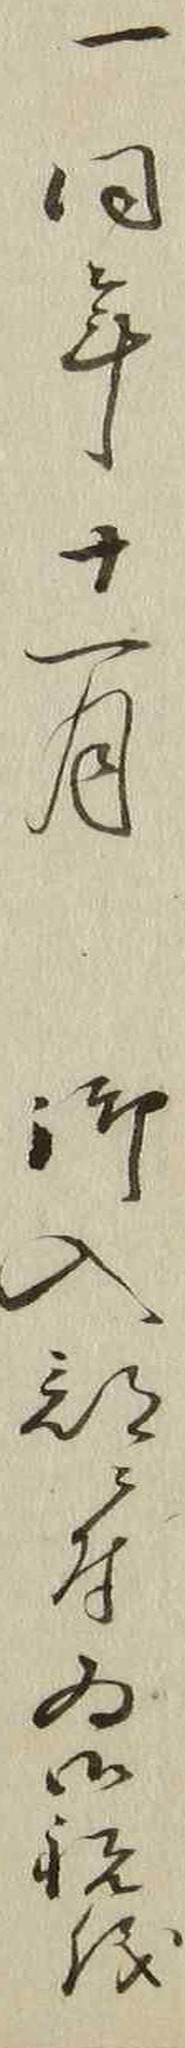一同年十一月御入部ニ付為御祝儀
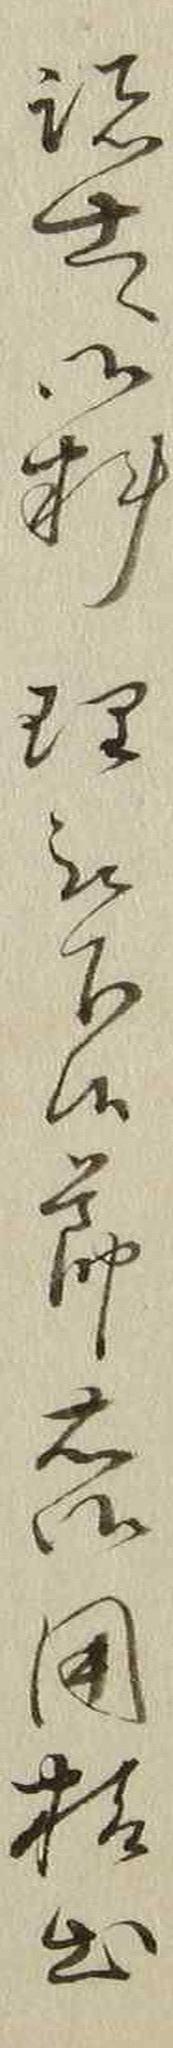諸士へ御料理被下候節右御用精出
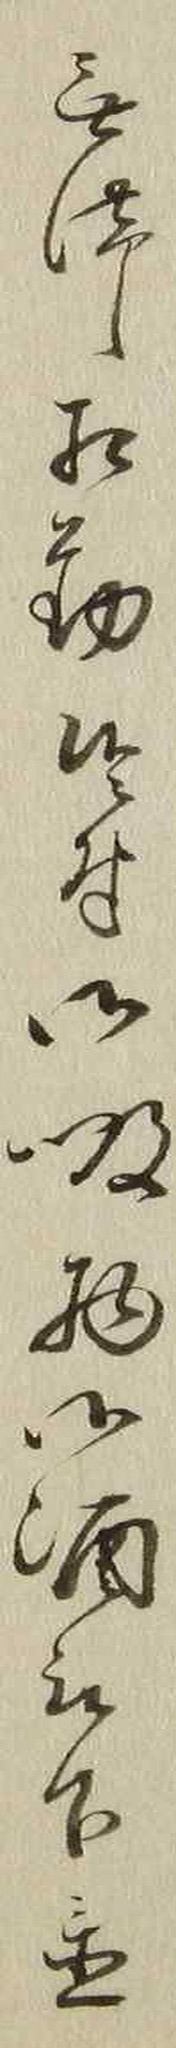無滞相勤候ニ付御吸物御酒被下置
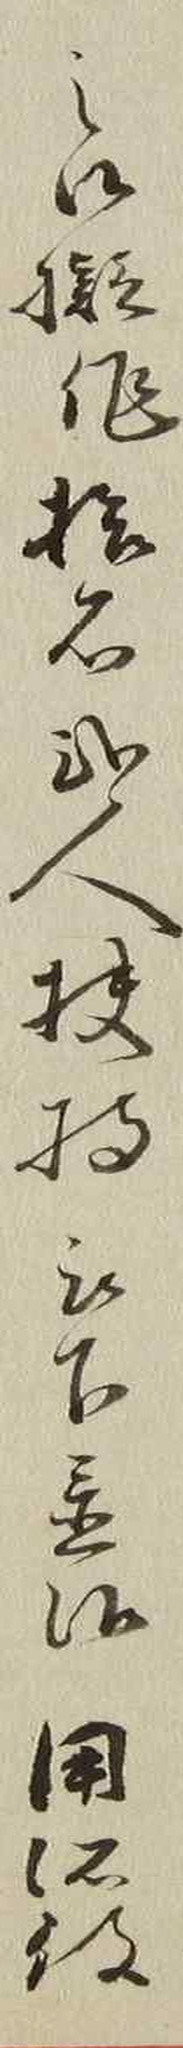之御擬作拾石弐人扶持被下置候囲所役
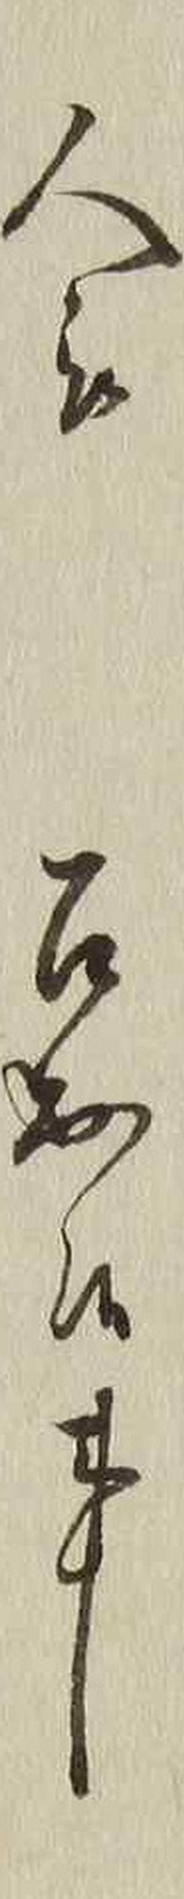人被召出候事
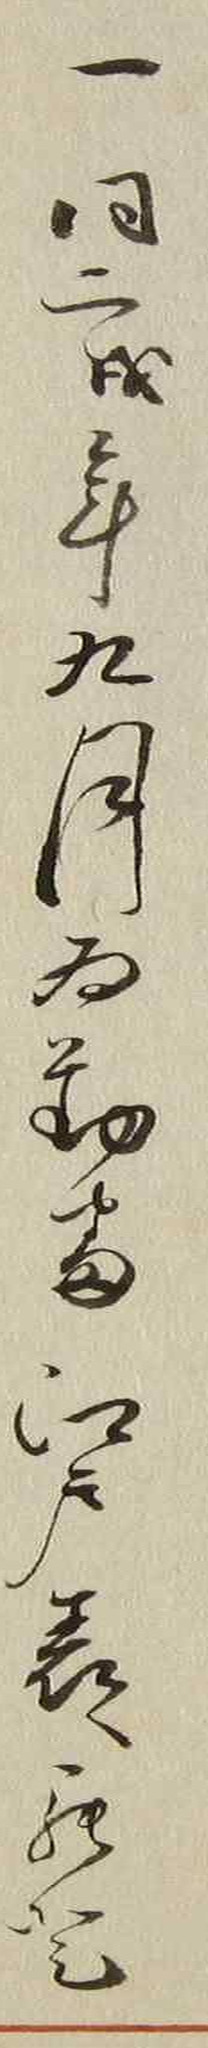一同二戌年九月為勤番江戸表へ罷登
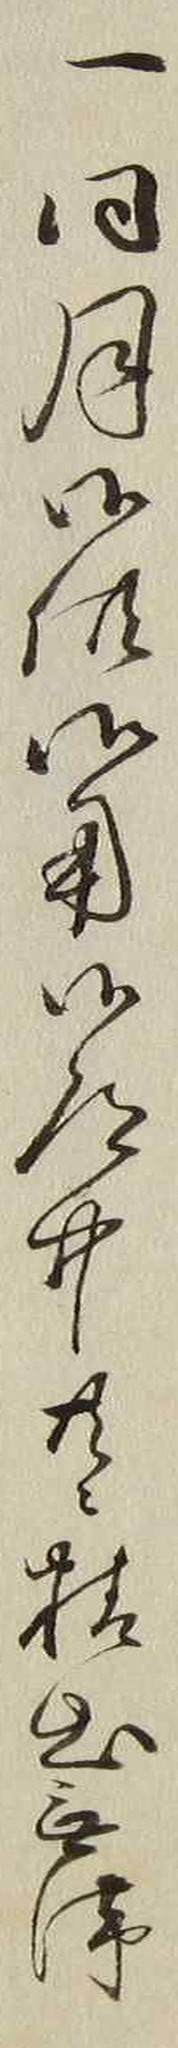一同月御供御用御道中共ニ精出無滞
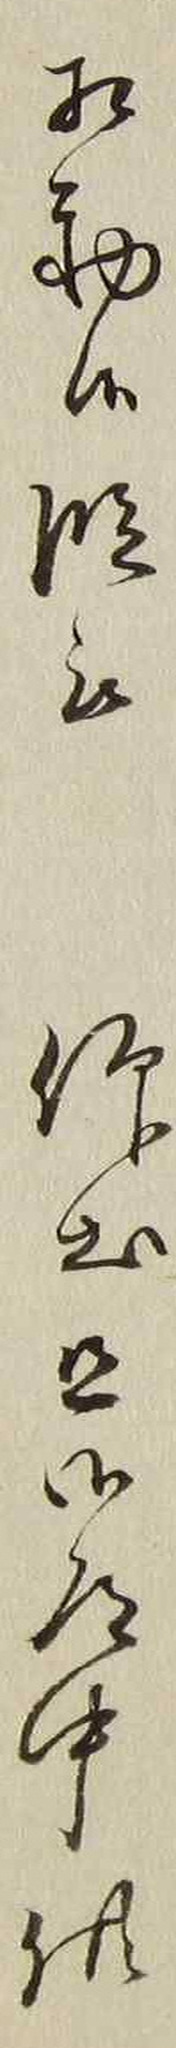相勤候段被仰出且御道中供
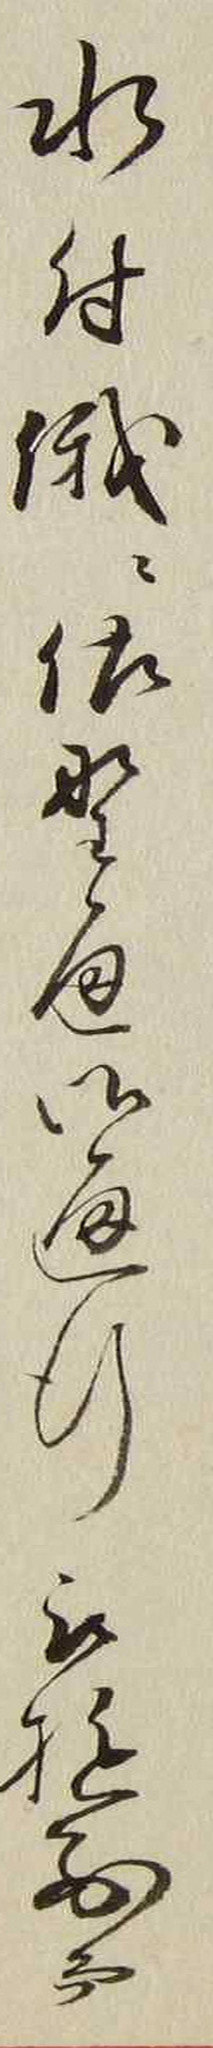水付俄ニ佐野通御通行被遊別而
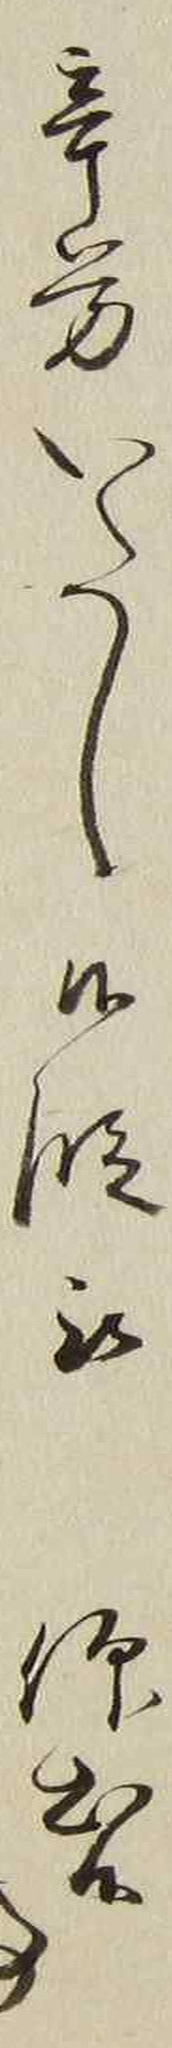辛労いたし候段被仰出候事
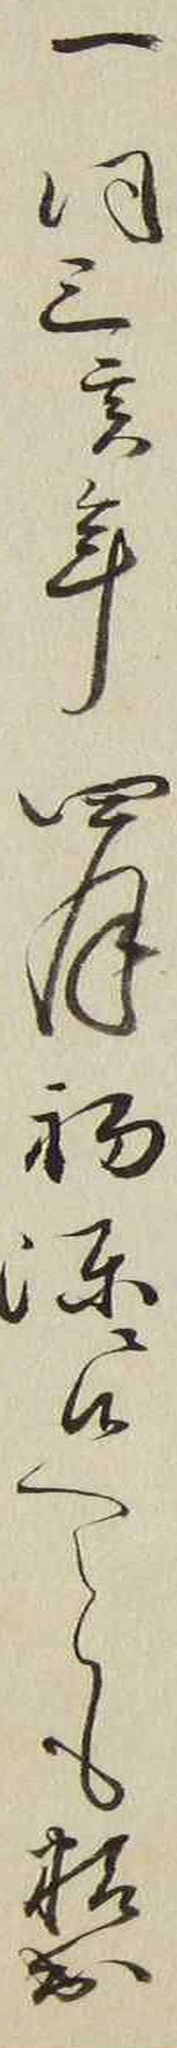一同三亥年四月初陣ニ候へとも精出

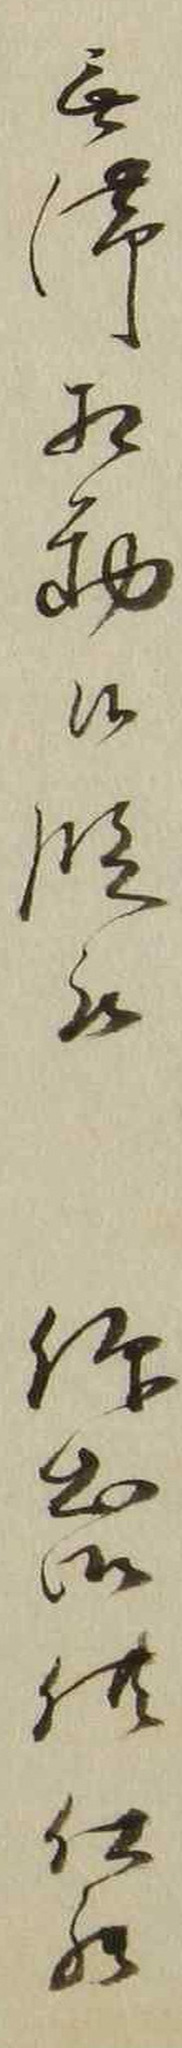無滞相勤候段被仰出御供仕罷
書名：諸士系譜　巻之52　に之部3
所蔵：会津若松市立会津図書館
